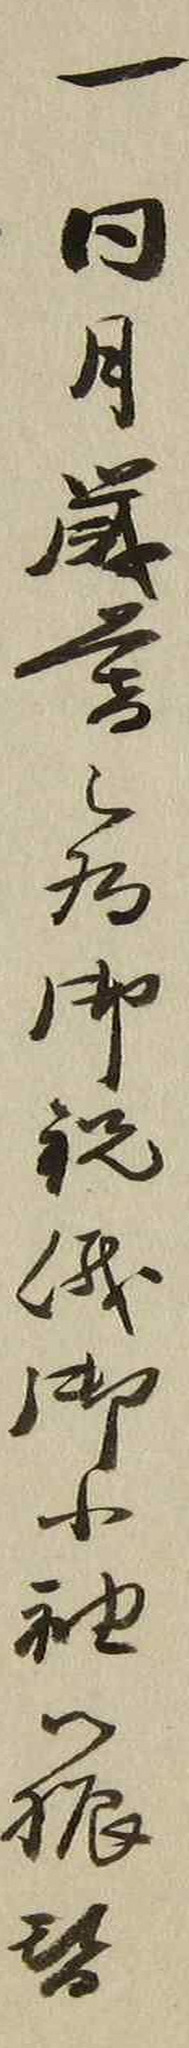一同月歳暮之為御祝儀御小袖御振替
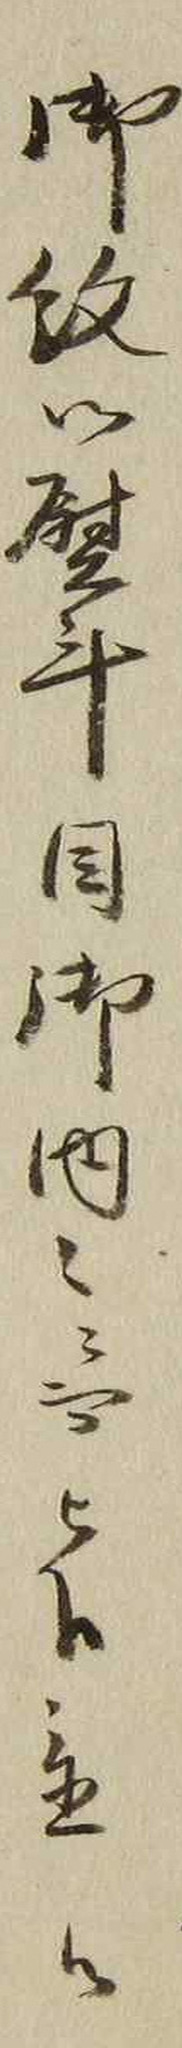御紋御の熨斗目御内々ニ而被下置候
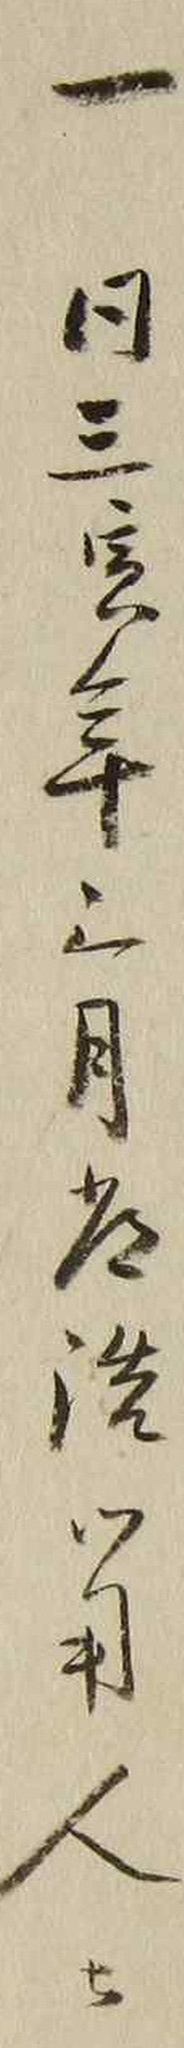一同三寅年三月常詰御用人被
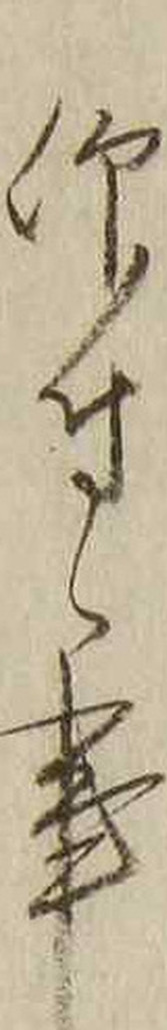仰付候事
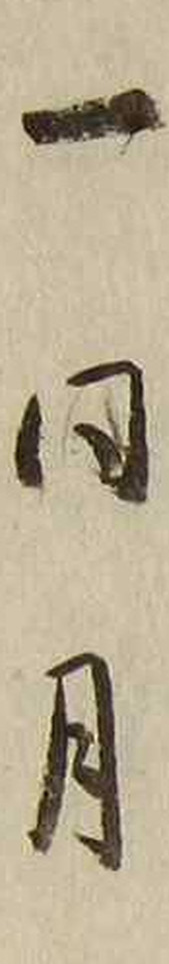一同月

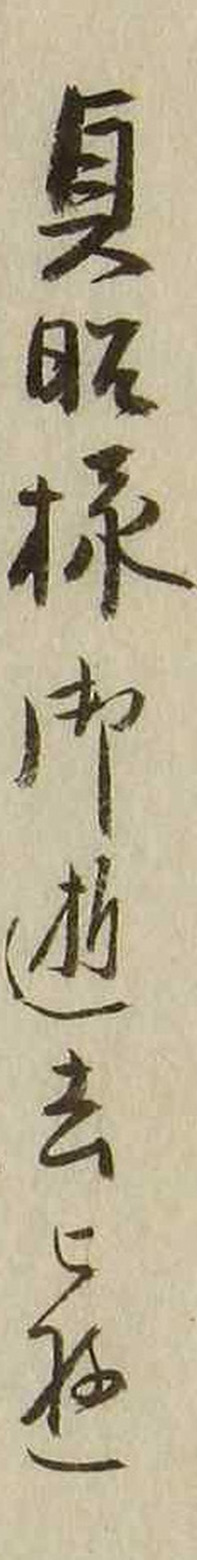真昭様御逝去被遊
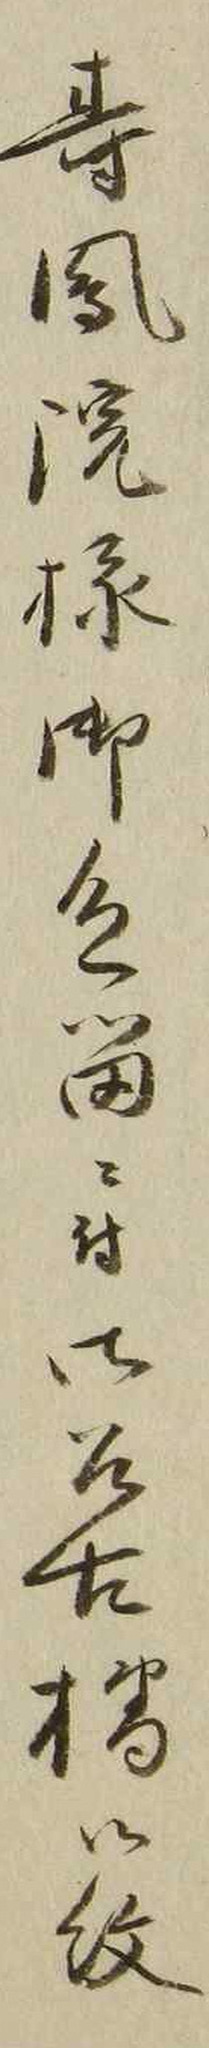寿鳳院様御色留ニ付御召古橘御紋
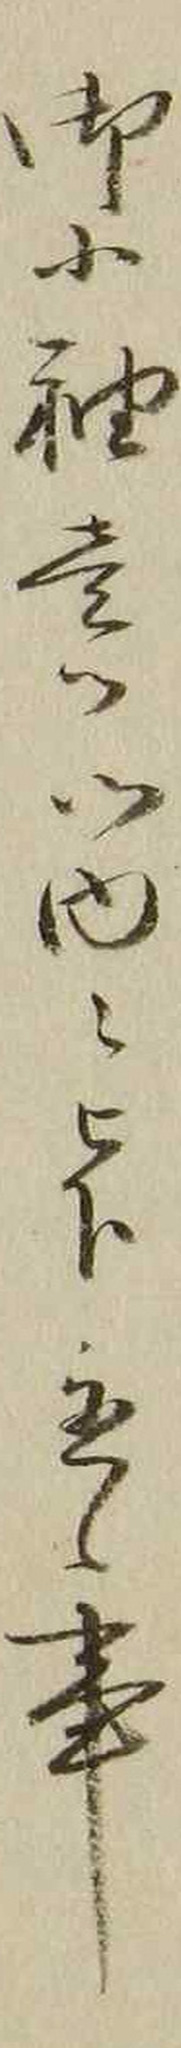御小袖壱ツ御内々被下置候事
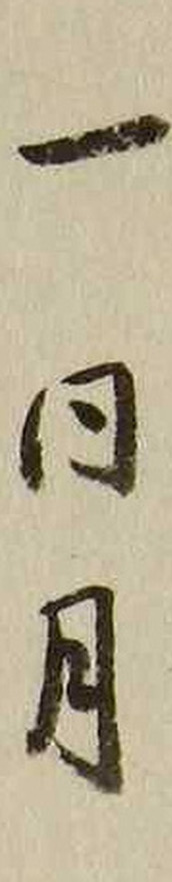一同月
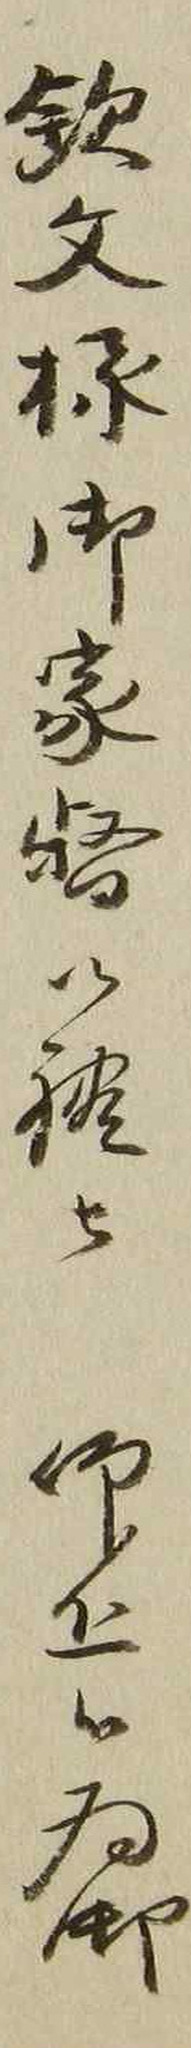欽文様御家督御礼被仰上候為御
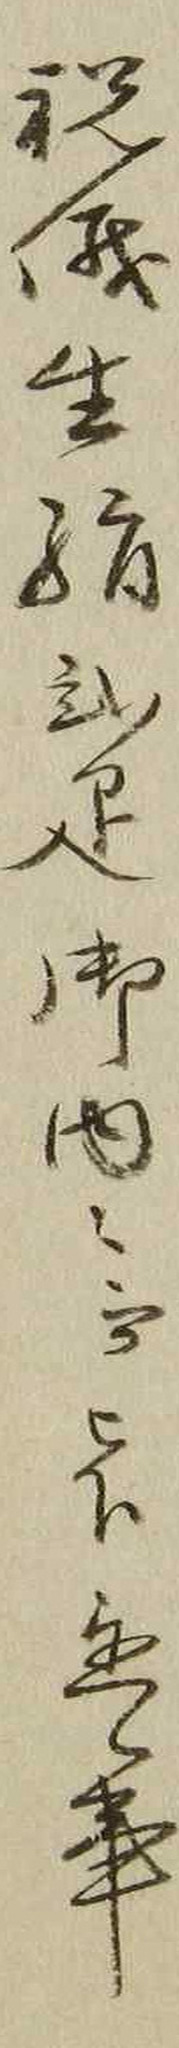祝義生絹弐疋御内々ニ而被下置候事
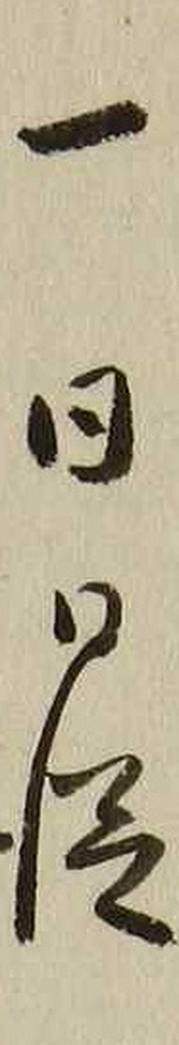一同日従
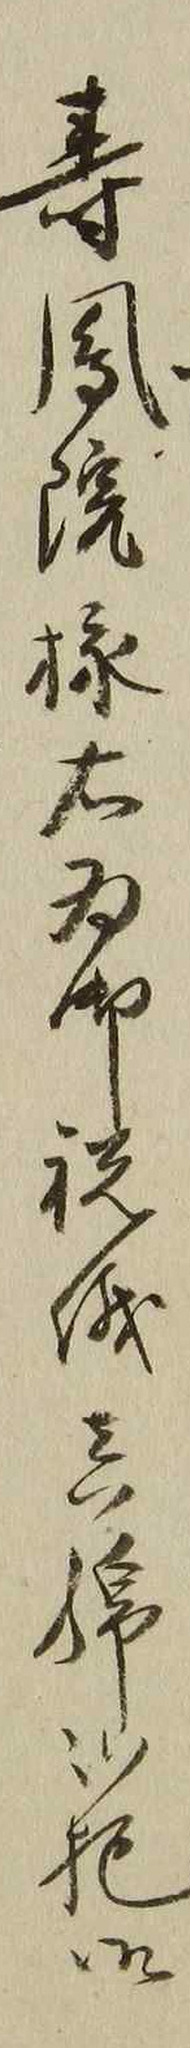寿鳳院様右為御祝儀真綿弐把御
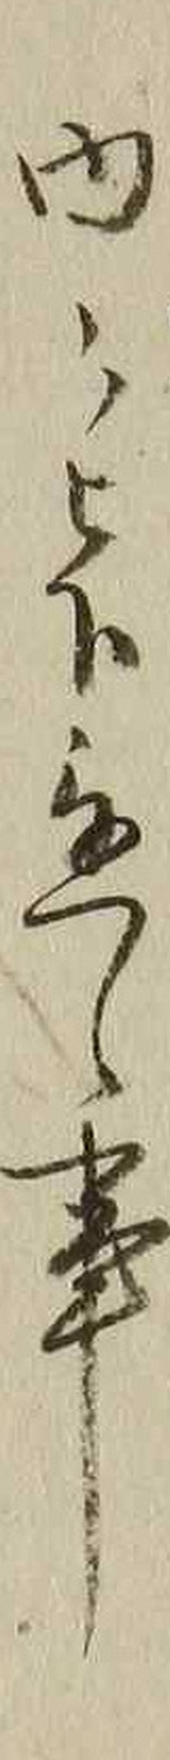内々被下置候事
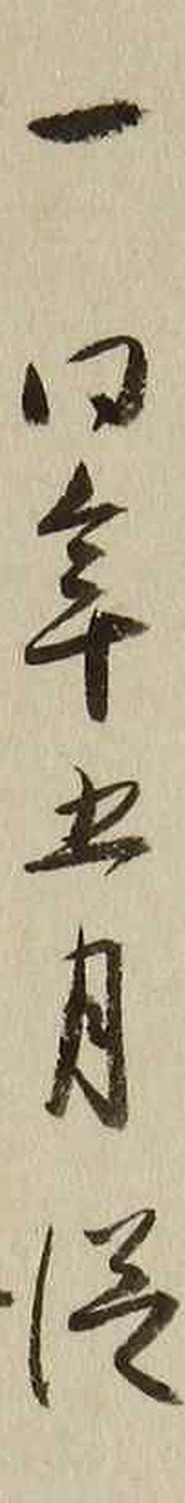一同年五月従
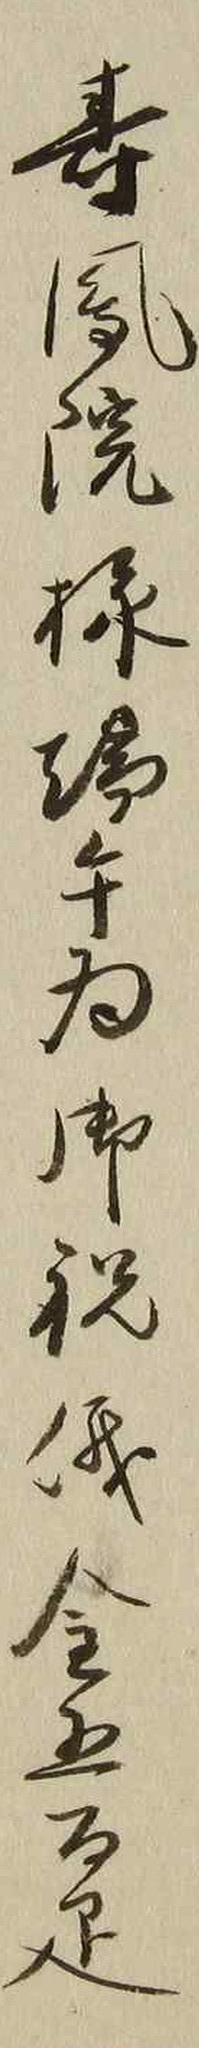寿鳳院様端午為御祝儀金五百疋
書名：諸士系譜　巻之261　あ之部14
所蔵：会津若松市立会津図書館
